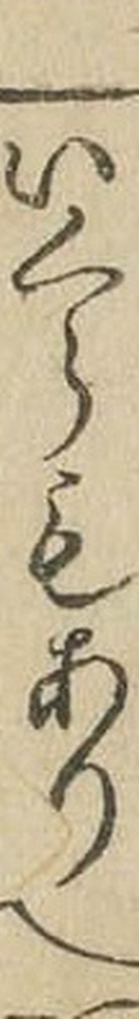いくらもあり
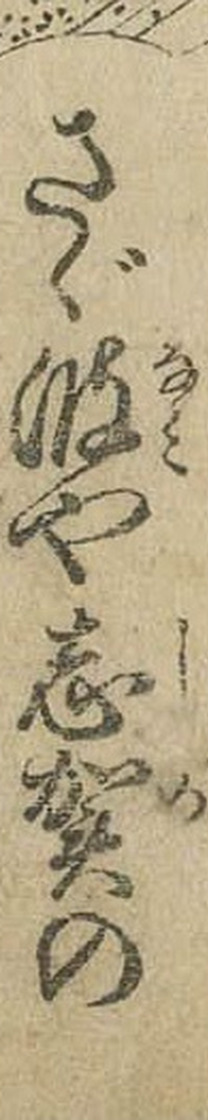さゞ波や志賀の
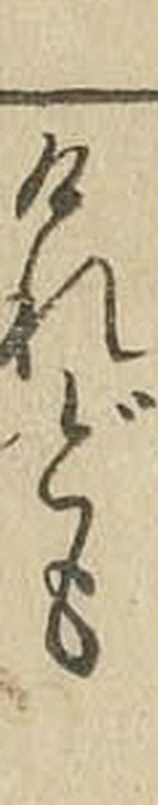けれども
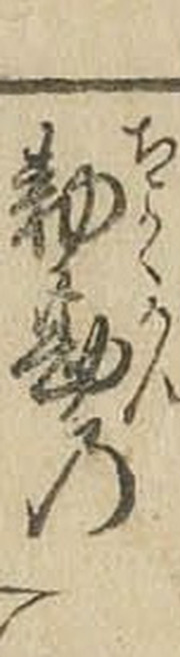勅勘の
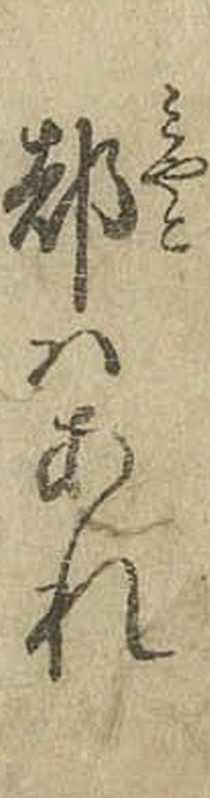都はあれ
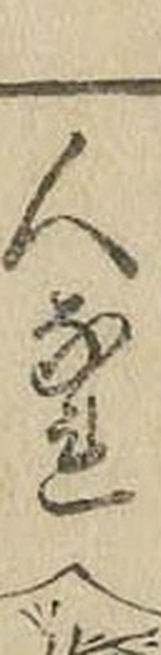人なれ
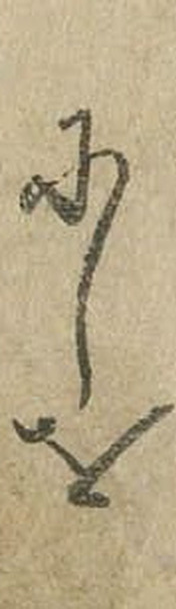にしを
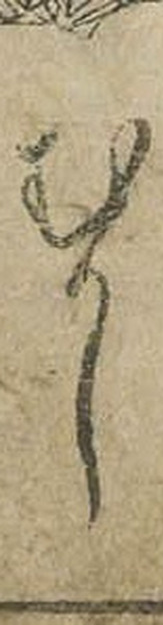むかし
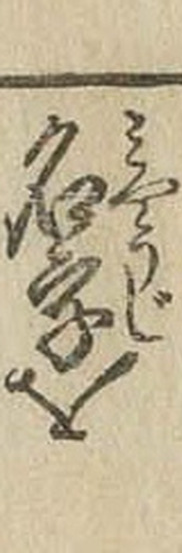名字を
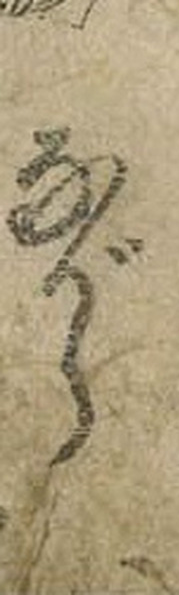ながら
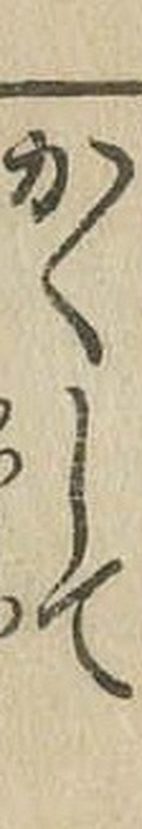かくして
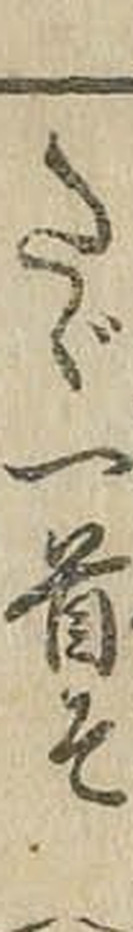たゞ一首ぞ
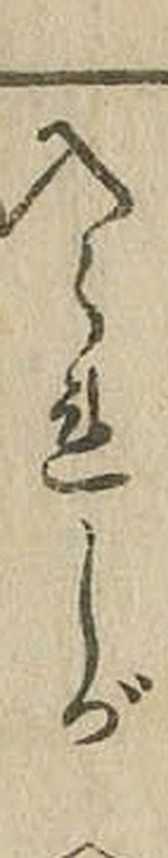入られしが
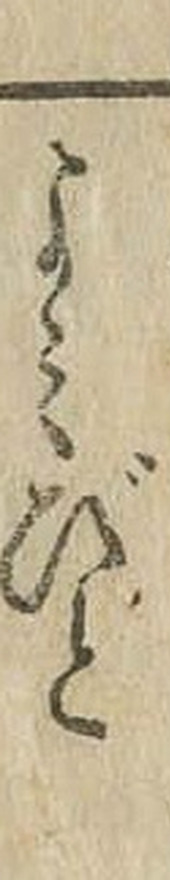よみびと
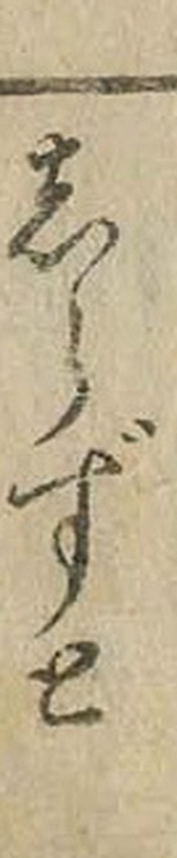しらずと
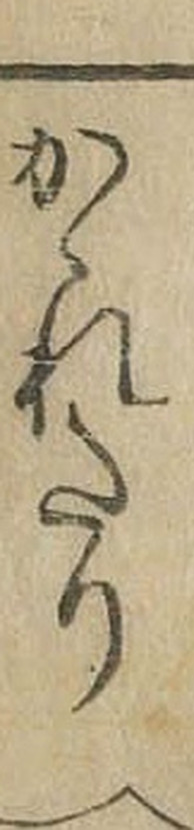かゝれたり
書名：絵本写宝袋 9巻 1之巻
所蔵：東京学芸大学教育コンテンツアーカイブ
